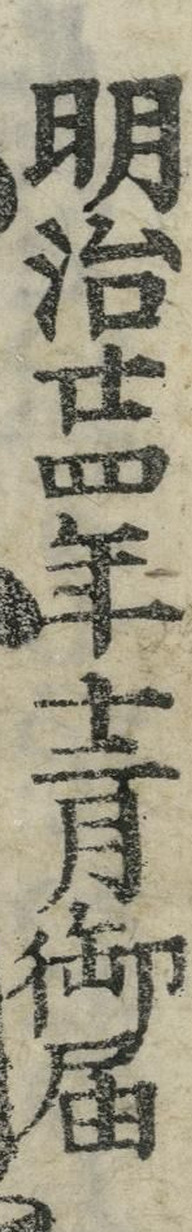明治廿四年十二月御届
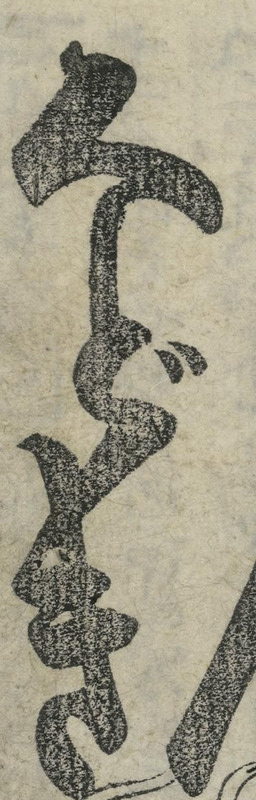くどき

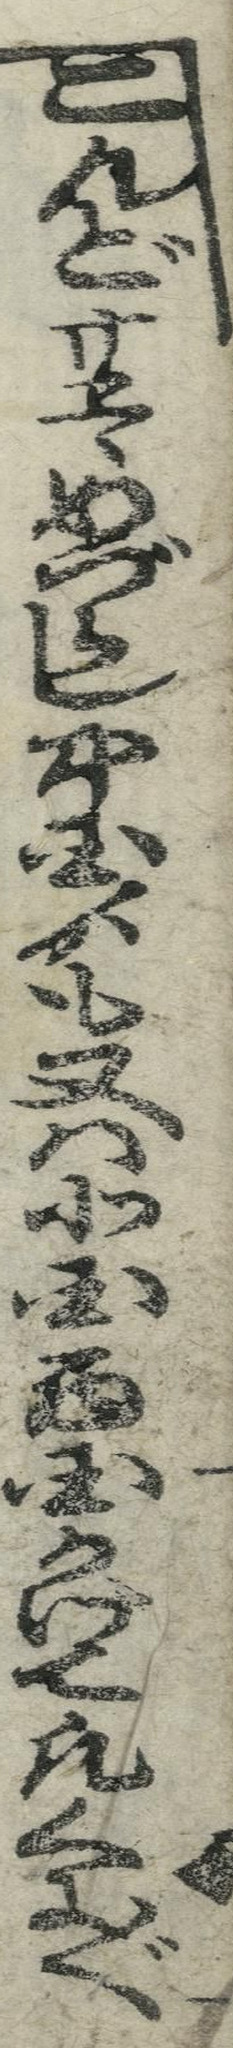〽こんどサエヽめづらし中国ゟも又は北国西国かつて凡くに〴〵
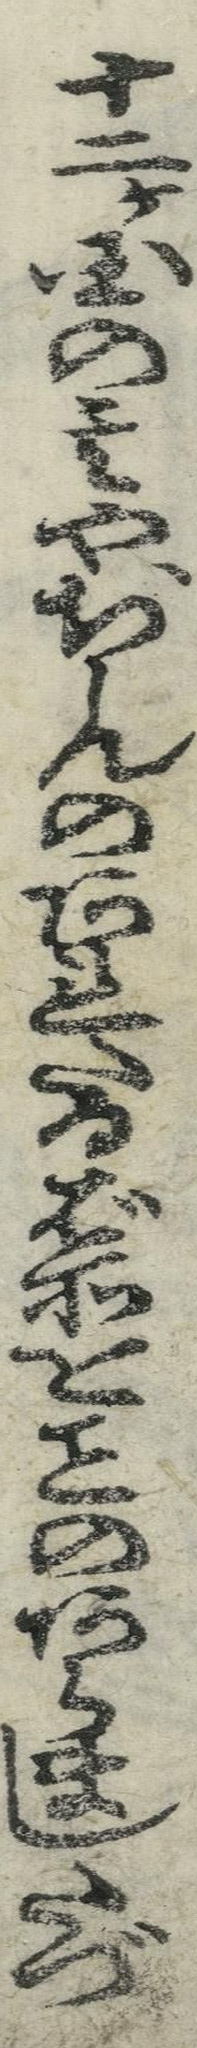十二ヶ国の其やぢしんのあれたるば所をことのあらましたづ
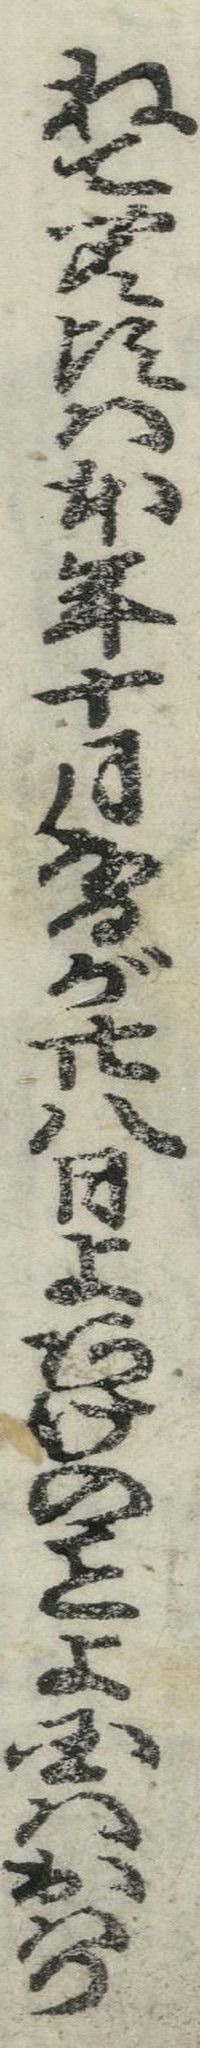ねてのすは本年十月なるが廿八日よあけのことよ国はおはり
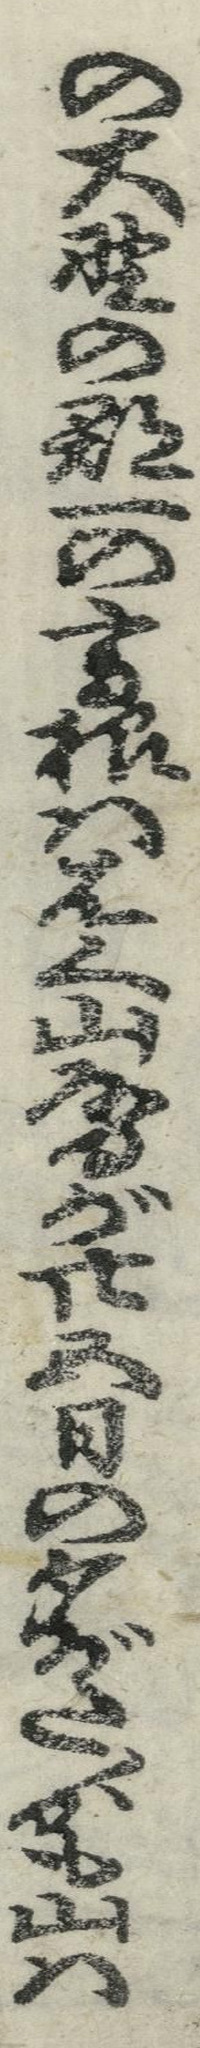の大野の郡一の高根ははく山なるが廿五日の夕がたゟも山は
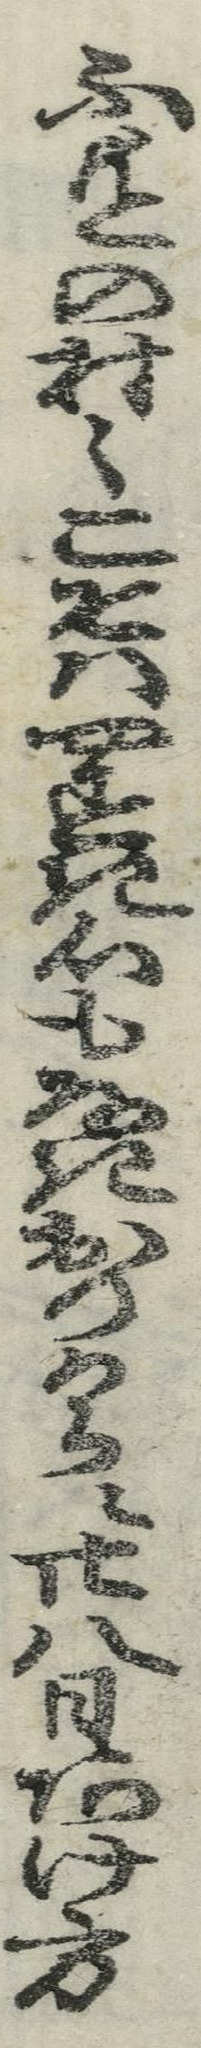ふもとの村々こそはやすき心もなきおりからに廿八日あけ方
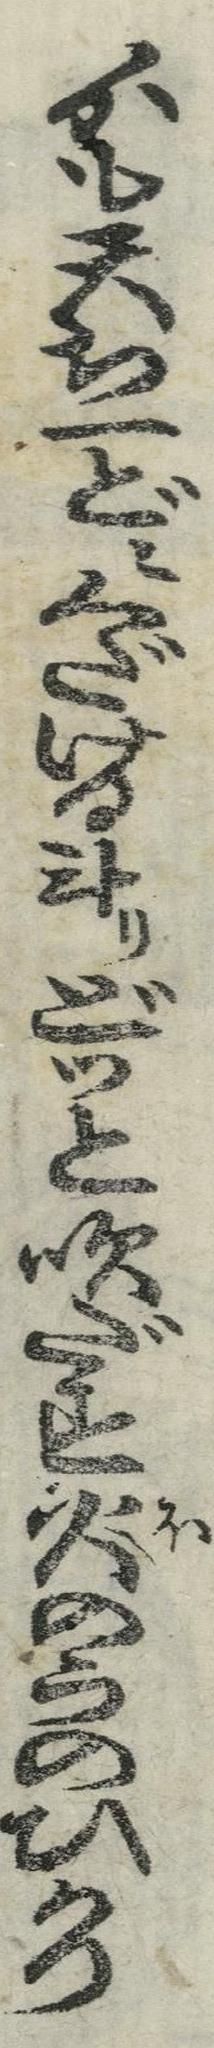ゟも天ち一どにくだける計りどつと吹だす火のうのひかり
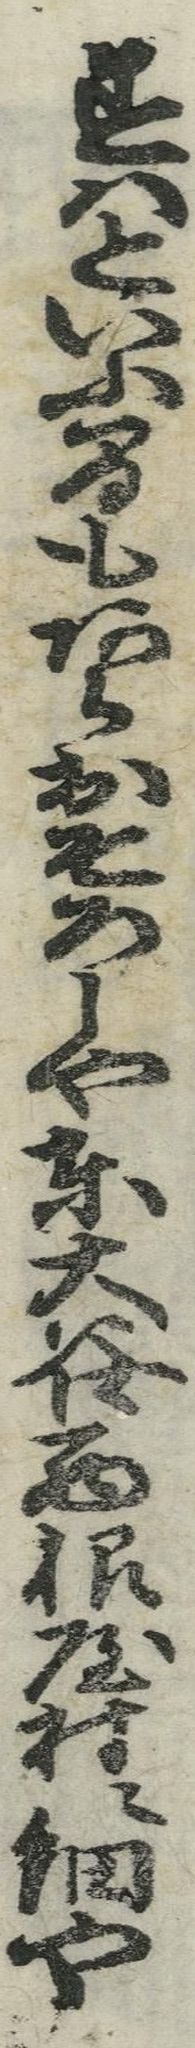すはといふ間もあらおそろしや東大谷西根屋村に細や
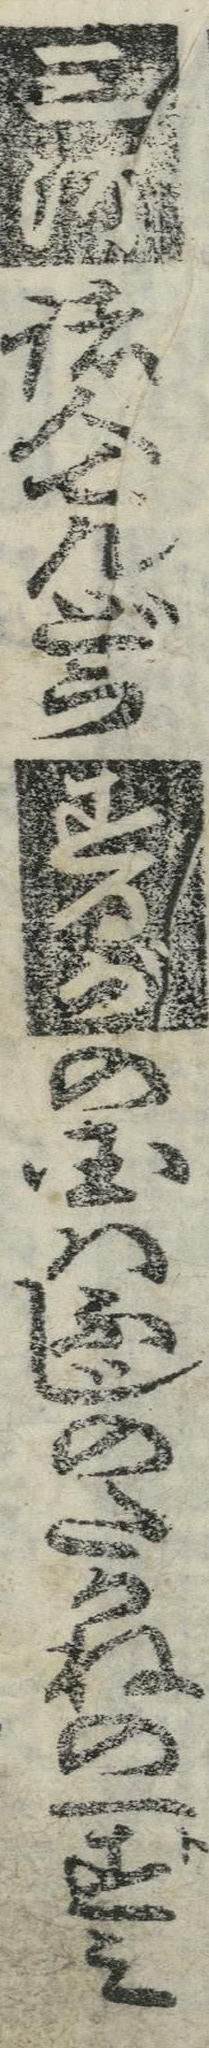三河諸人てんどうするがの国はふじのたかねの一トすみ
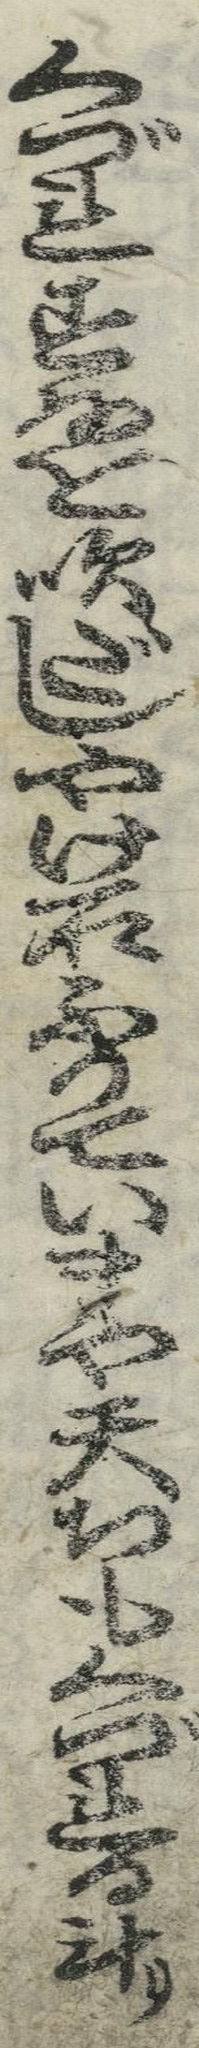くづれすなを吹だしやけ石ふりていまや天ちもくづれる計り

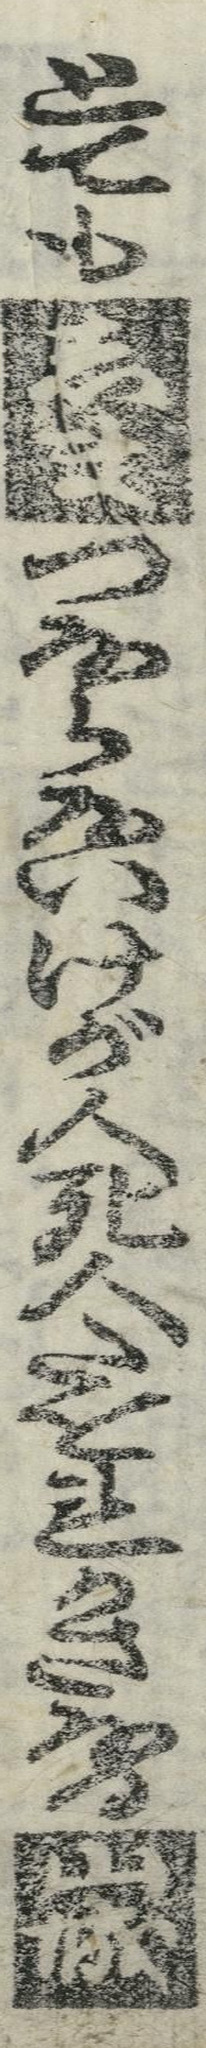とてもしまつならないけが人死人たをれかさなる山城
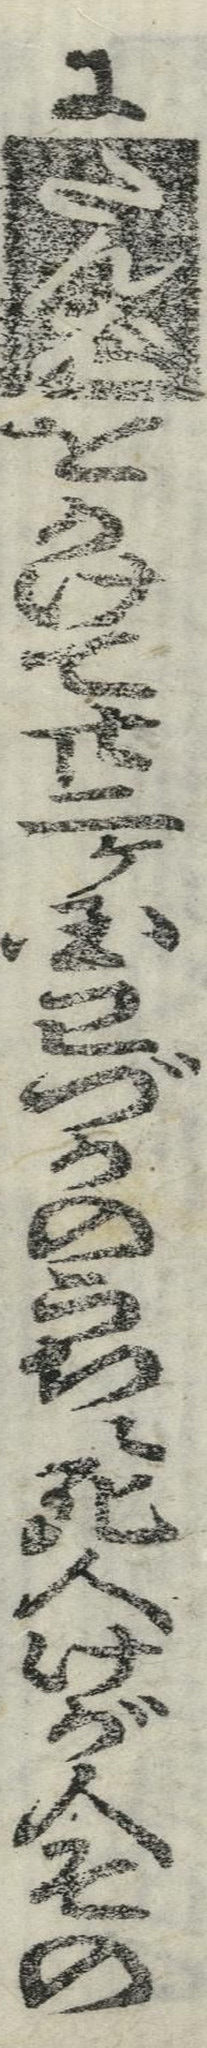にたんばをかけて廿二ヶ国わづかのうちに死人けが人その
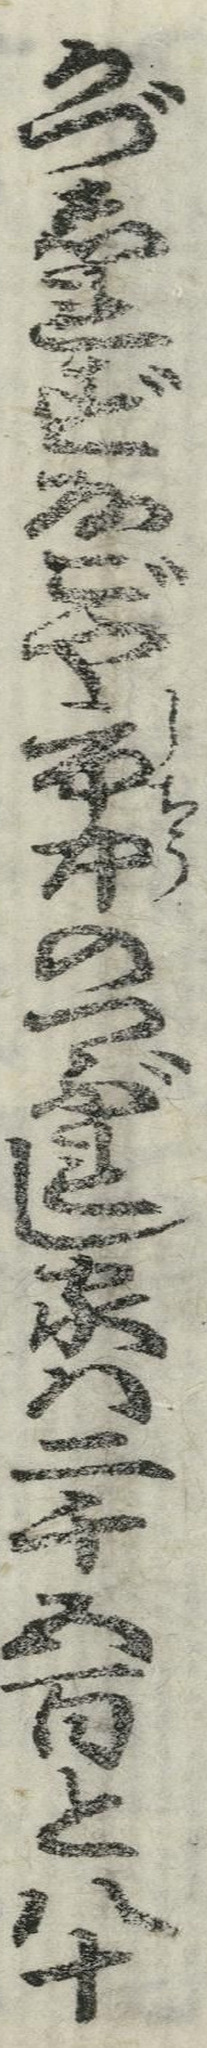かづしれずなごや市中のつぶれし家は二千五百と八十
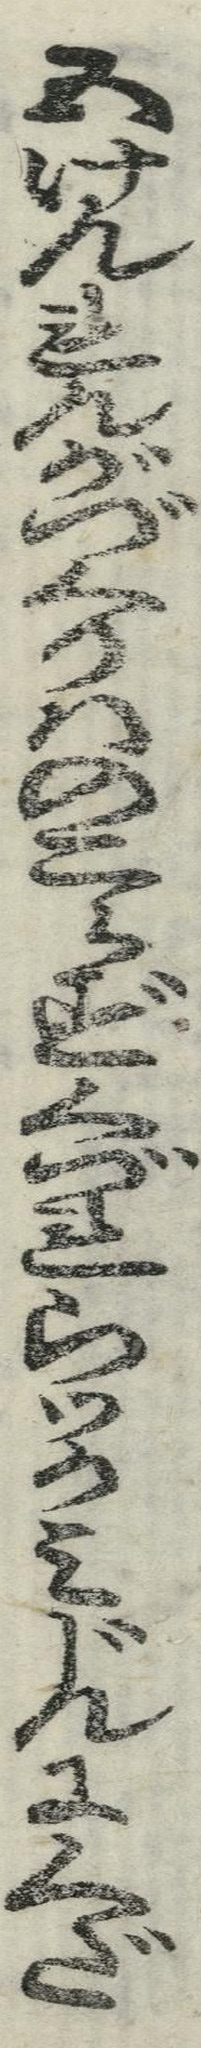五けんれんがづくりはのこらずくづれらつかみじんにくだ
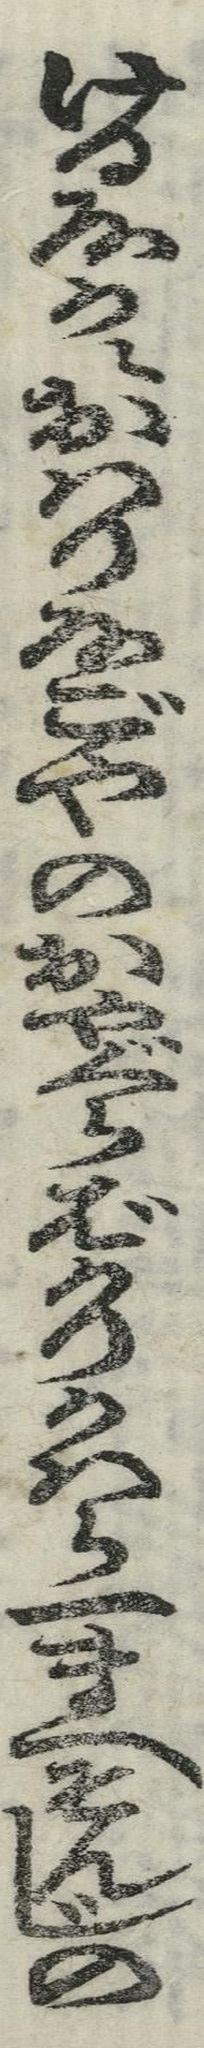けるなかにおはりなごやのおやぐらばかりかはら一まへそんじの
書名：十二ヶ国大地しんくどき
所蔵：東京大学地震研究所図書室 Earthquake Research Institute Library, The University of Tokyo, JAPAN
